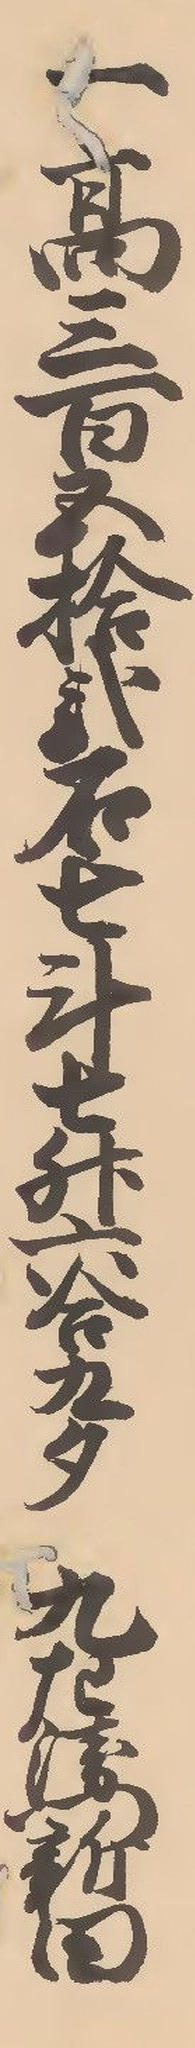一高三百五拾弐石七斗七升六合九勺九左衛門新田
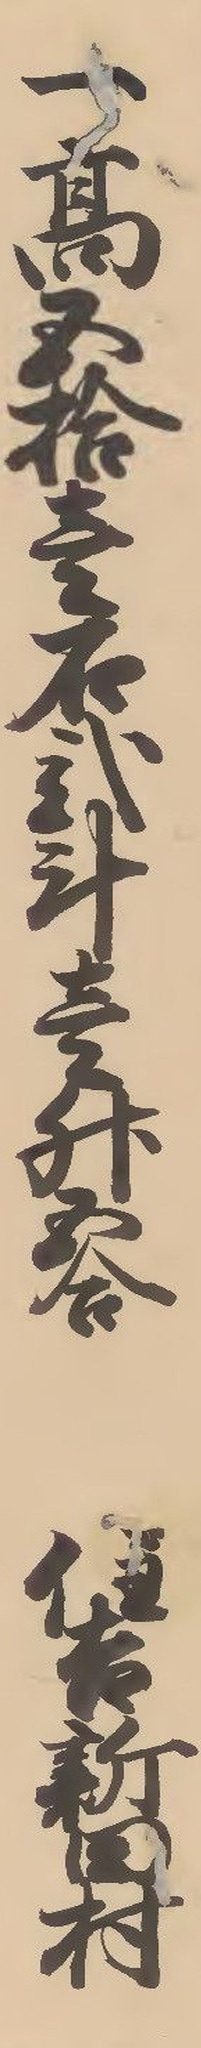一高五拾壱石弐斗壱升五合住吉新田村
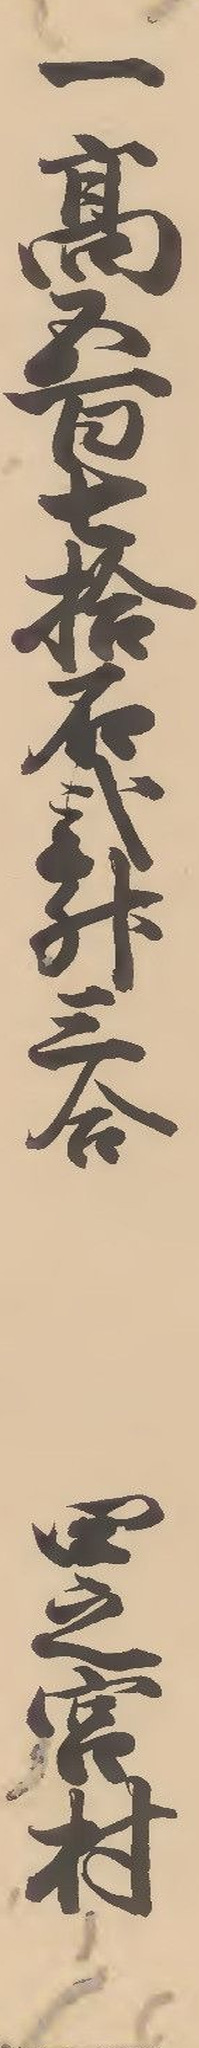一高五百七拾石弐升三合四之宮村
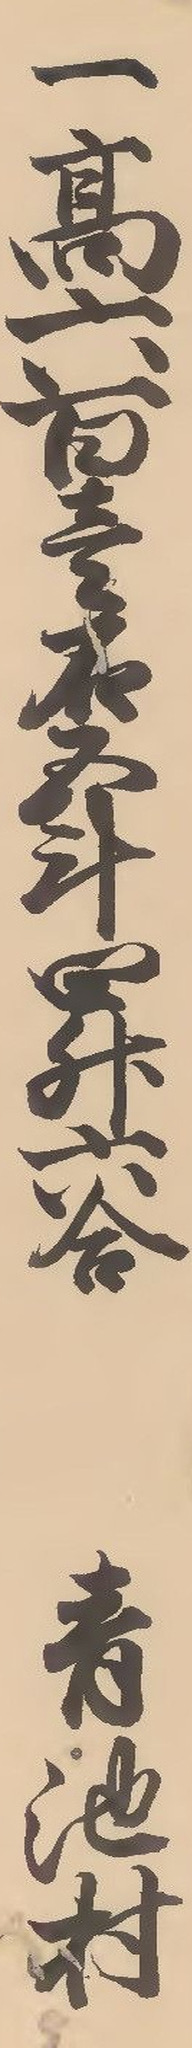一高六百壱石五斗四升六合青池村
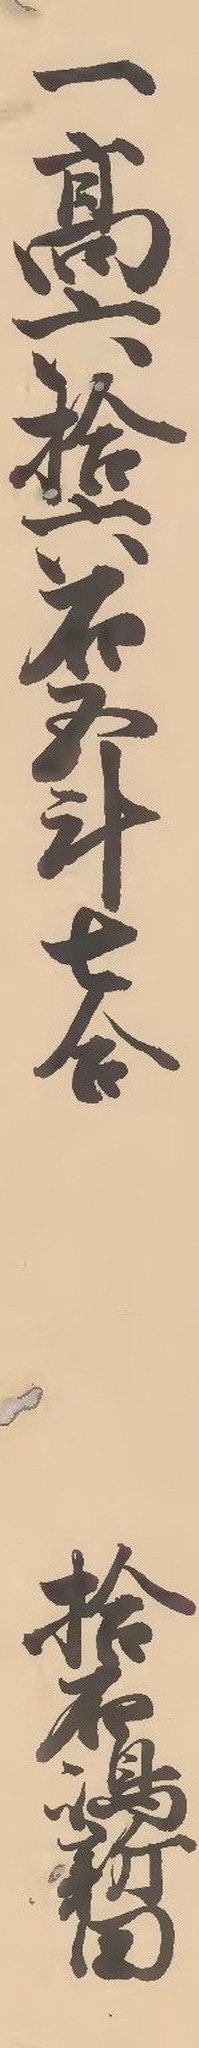一高六拾六石五斗七合拾石島新田

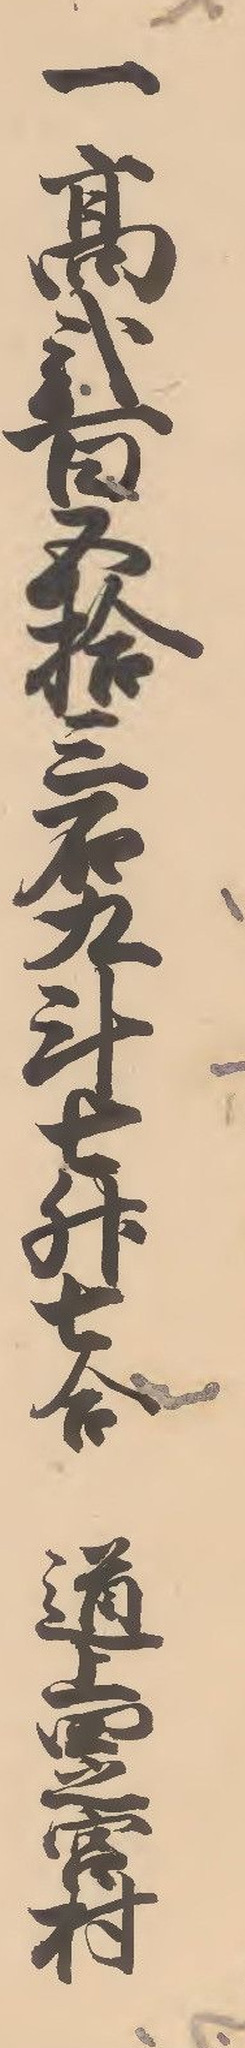一高弐百五拾三石九斗七升七合道上四之宮村
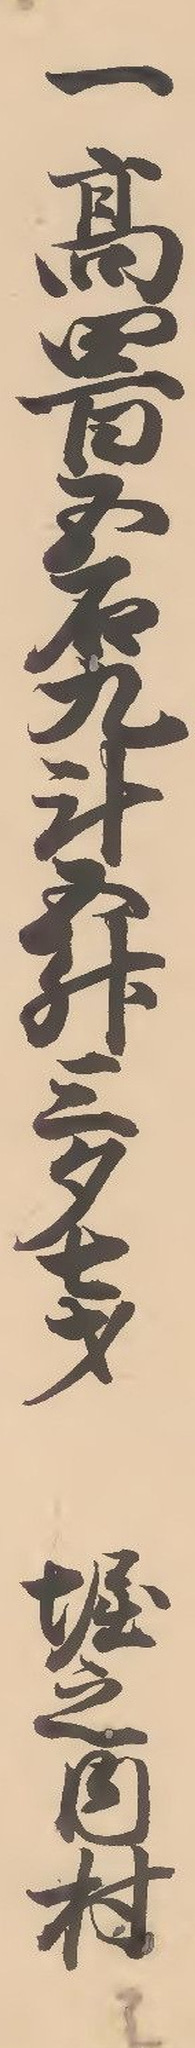一高四百五石九斗五升三勺七才堀之内村
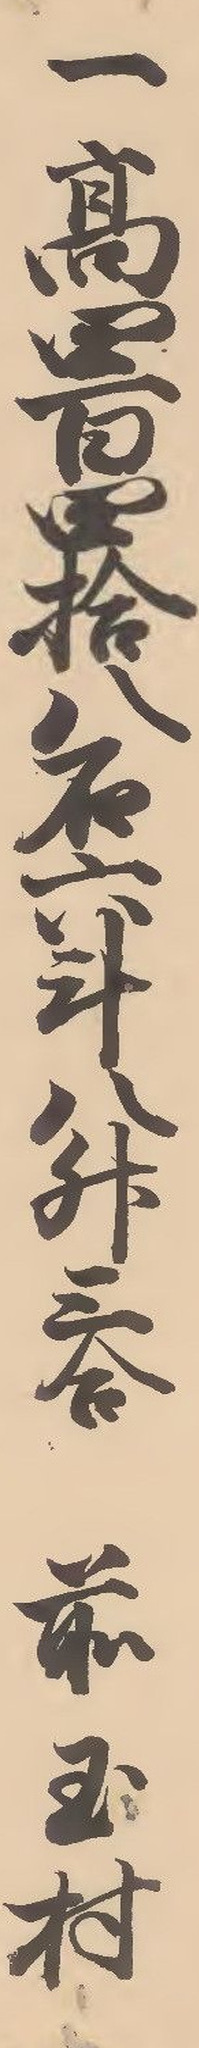一高四百四拾八石六斗八升三合前玉村
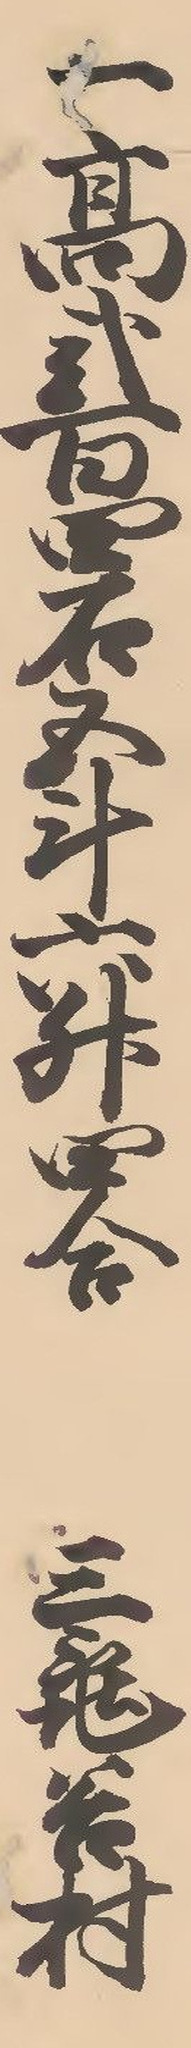一高弐百四石五斗六升四合三亀谷村
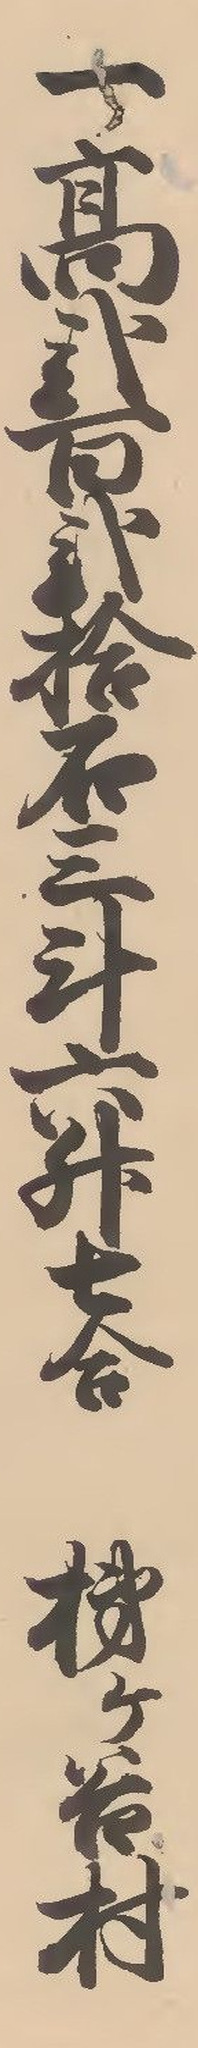一高弐百弐拾石三斗六升七合柿ヶ谷村
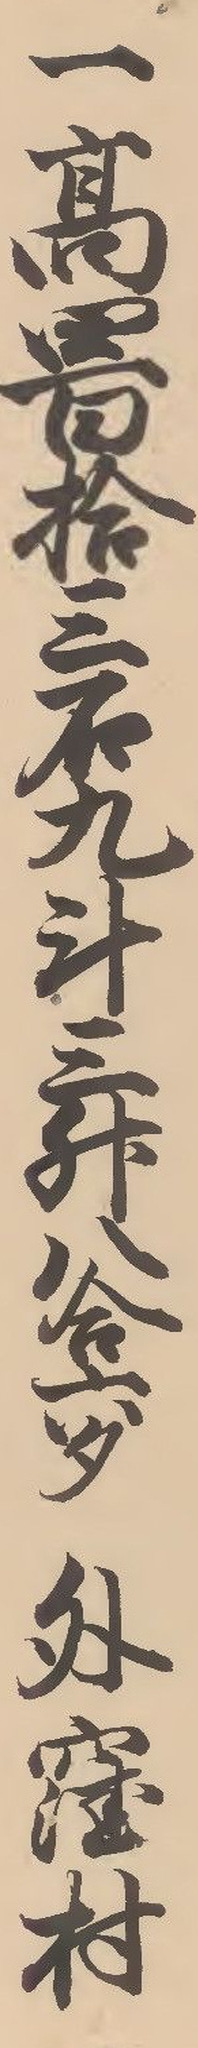一高四百拾三石九斗三升八合六勺外窪村
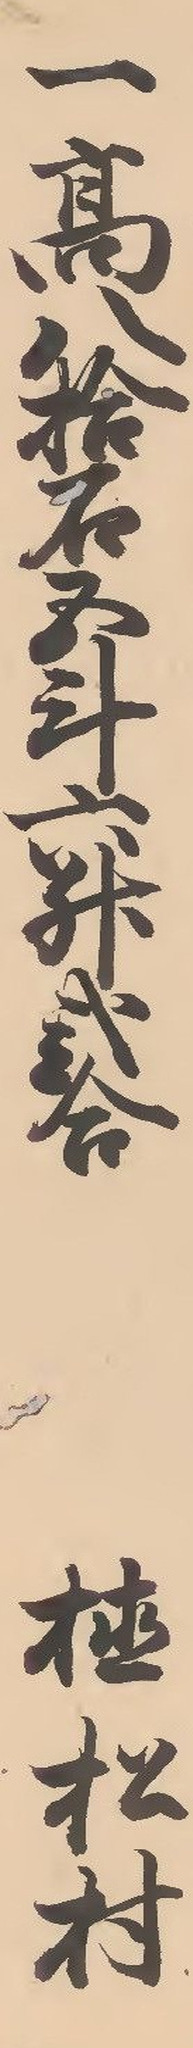一高八拾石五斗六升弐合植松村

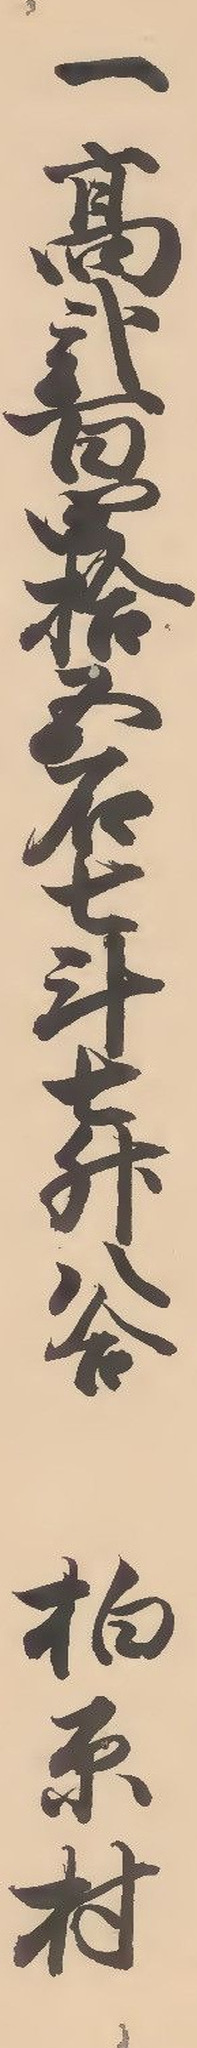一高弐百四拾五石七斗七升八合柏原村
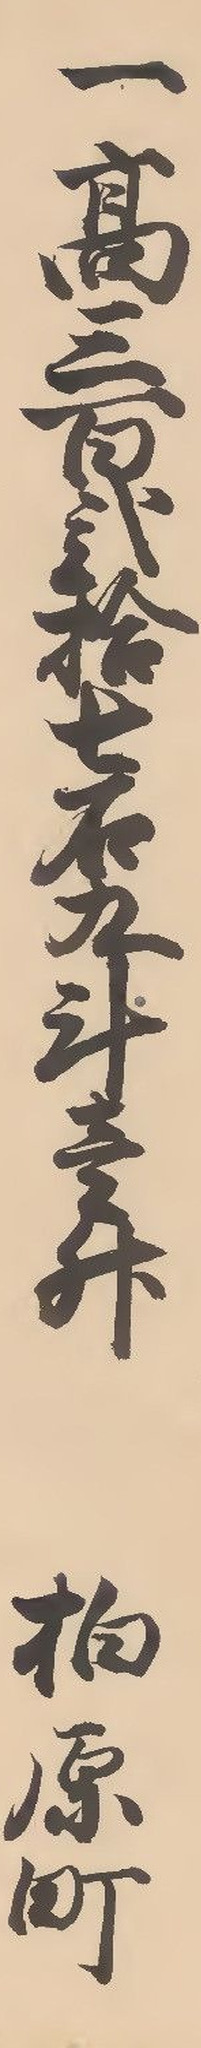一高三百弐拾七石九斗壱升柏原町
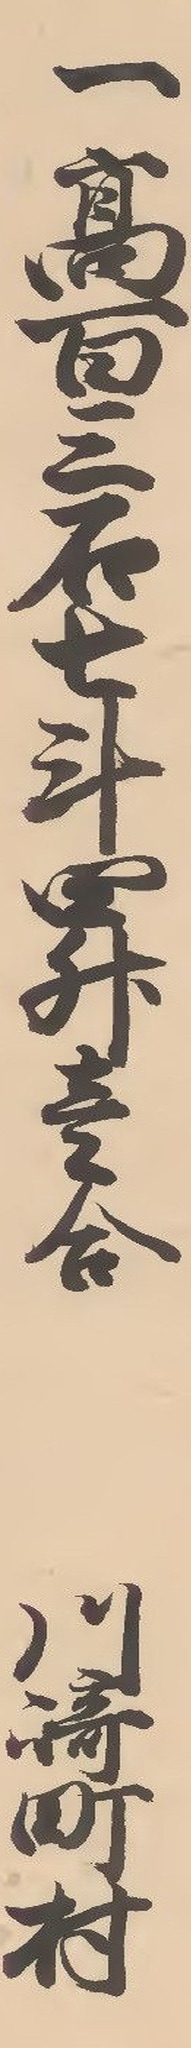一高百三石七斗四升壱合川崎町村
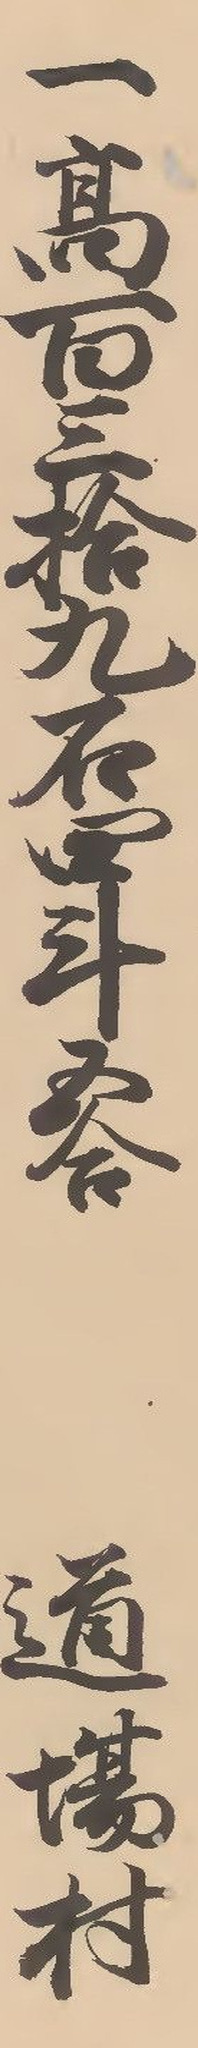一高百三拾九石四斗五合道場村
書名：遠江国郷帳
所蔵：国立公文書館 National Archives of Japan
